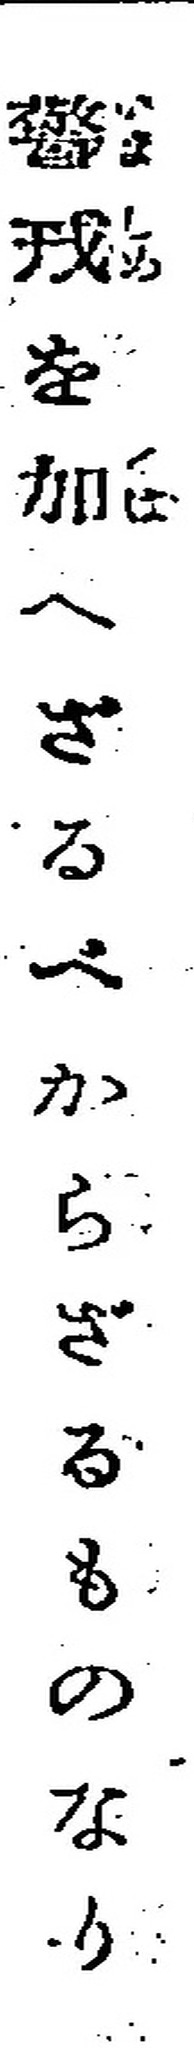警戒を加へざるべからざるものなり
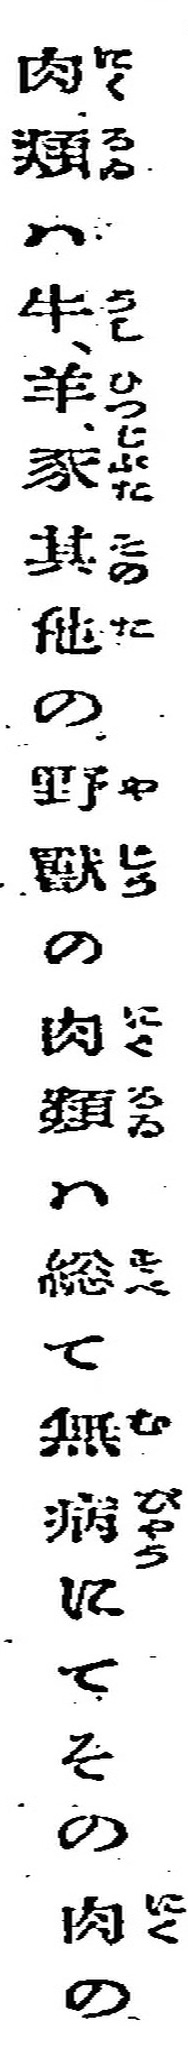肉類は牛、羊、豕其他の野獣の肉類は総て無病にてその肉の
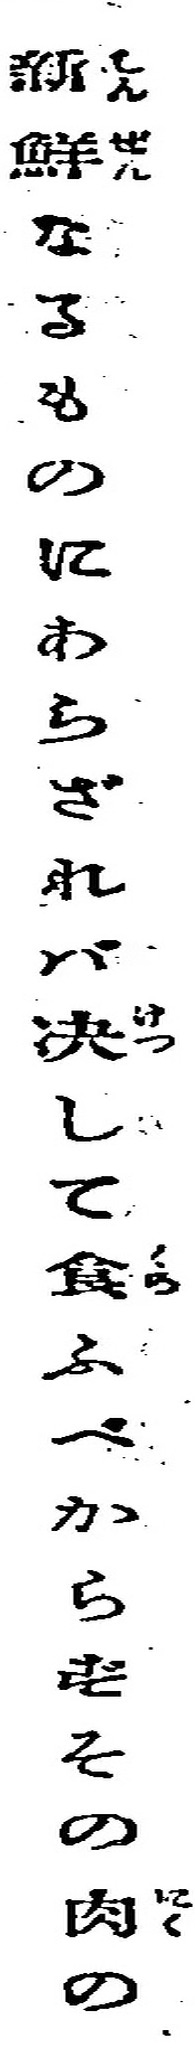新鮮なるものにあらざれば決して食ふべからずその肉の
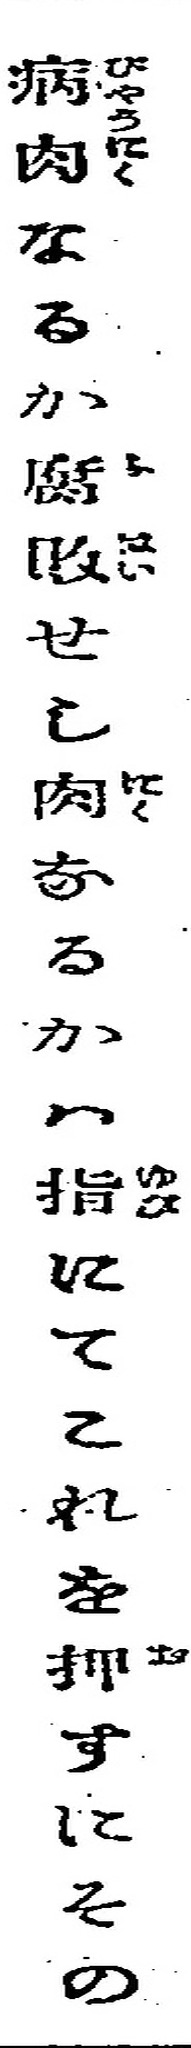病肉なるか腐敗せし肉なるかは指にてこれを押すにその
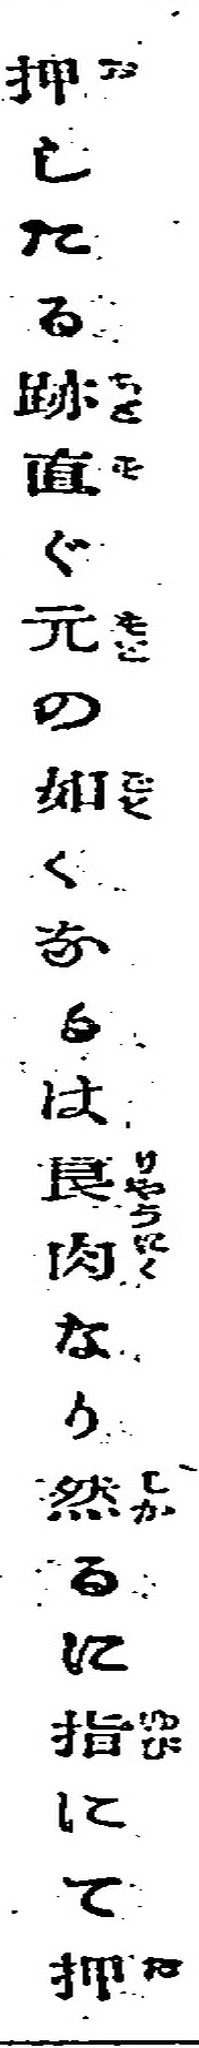押したる跡直ぐ元の如くなるは良肉なり然るに指にて押
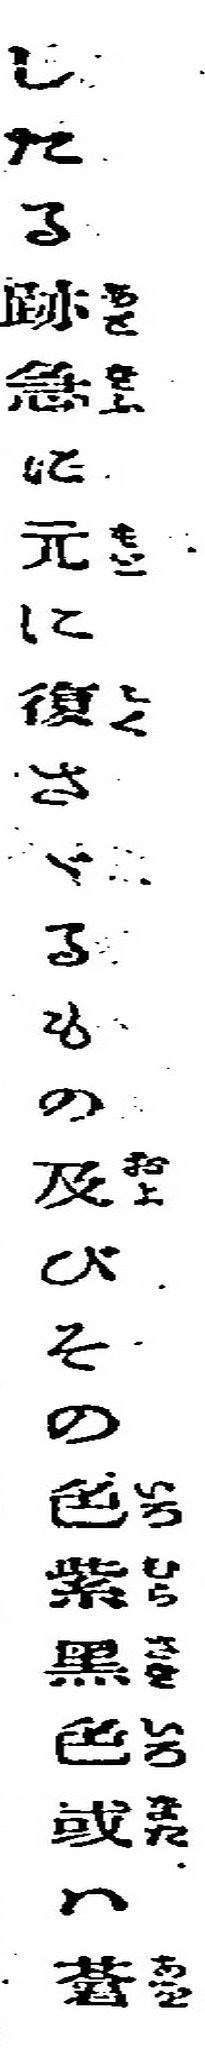したる跡急に元に復さゞるもの及びその色紫黒色或は蒼
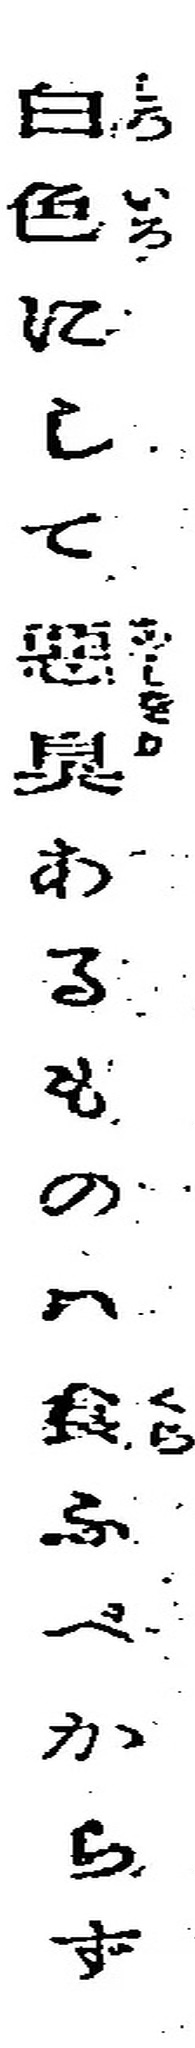白色にして悪臭あるものは食ふべからず
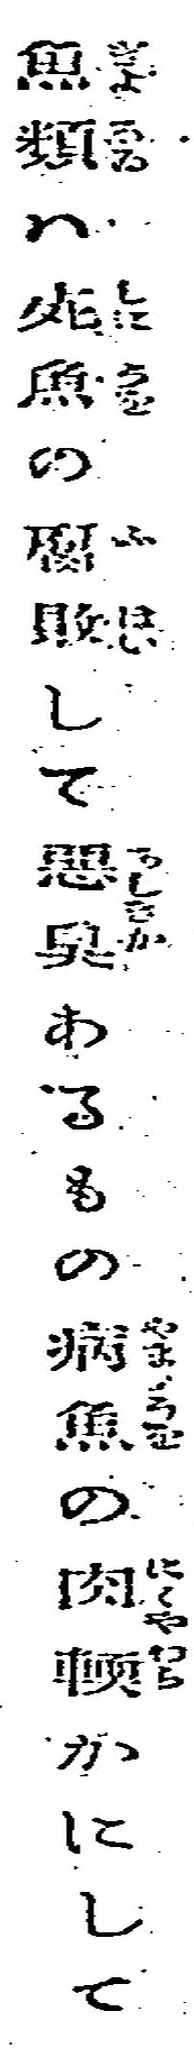魚類は死魚の腐敗して悪臭あるもの病魚の肉輭かにして
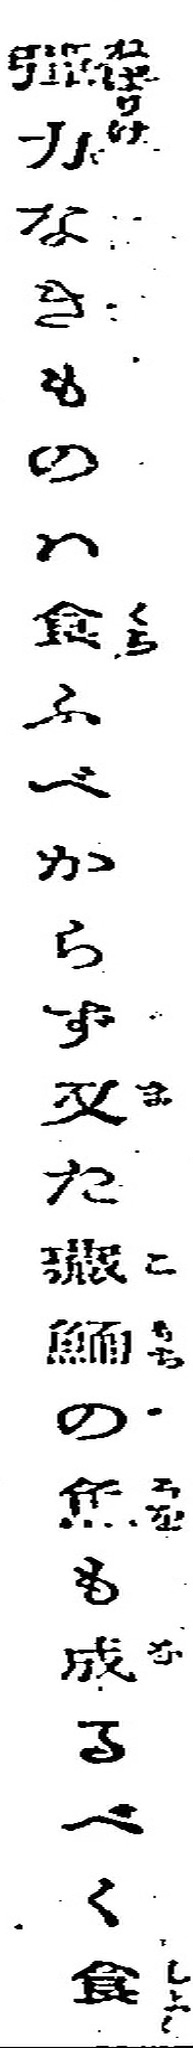弾力なきものは食ふべからず又た藏鮞の魚も成るべく食
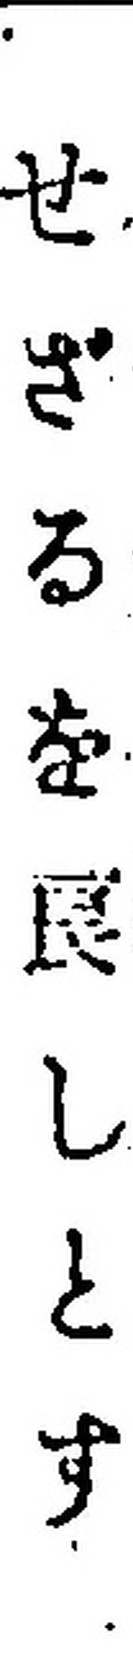せざるを良しとす
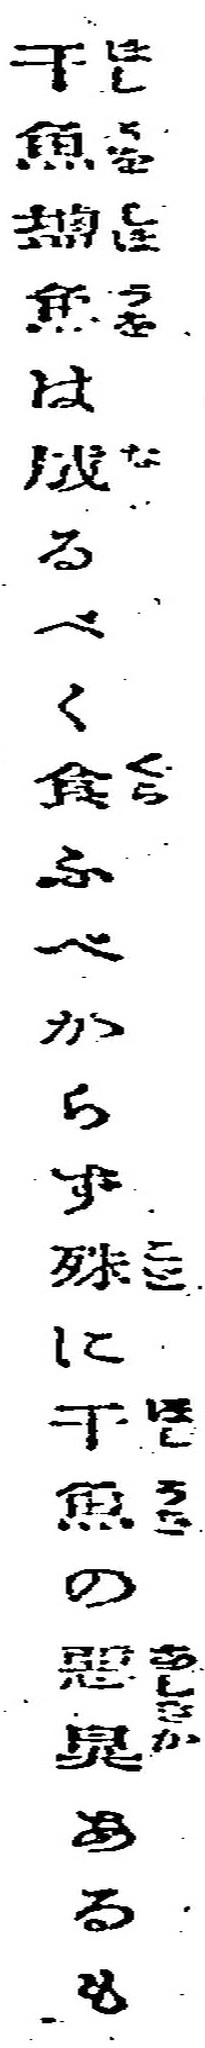干魚鹽魚は成るべく食ふべからず殊に干魚の悪臭あるも
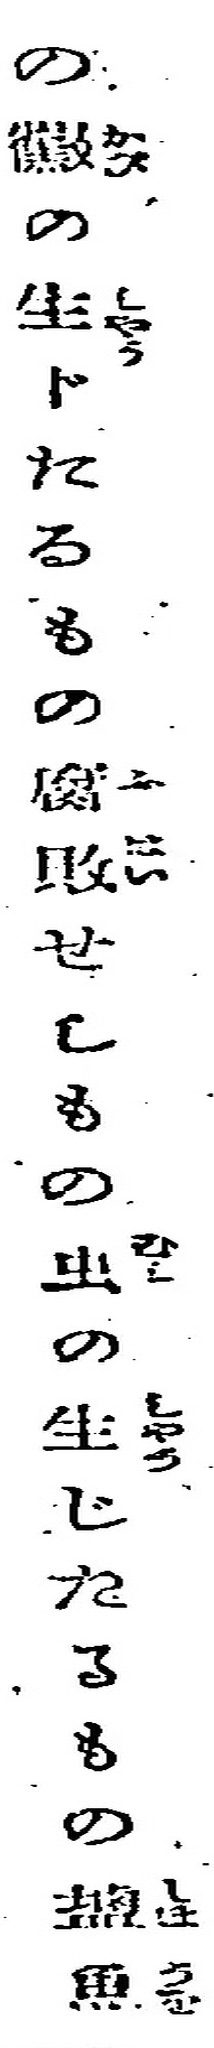の黴の生じたるもの腐敗せしもの虫の生じたるもの鹽魚
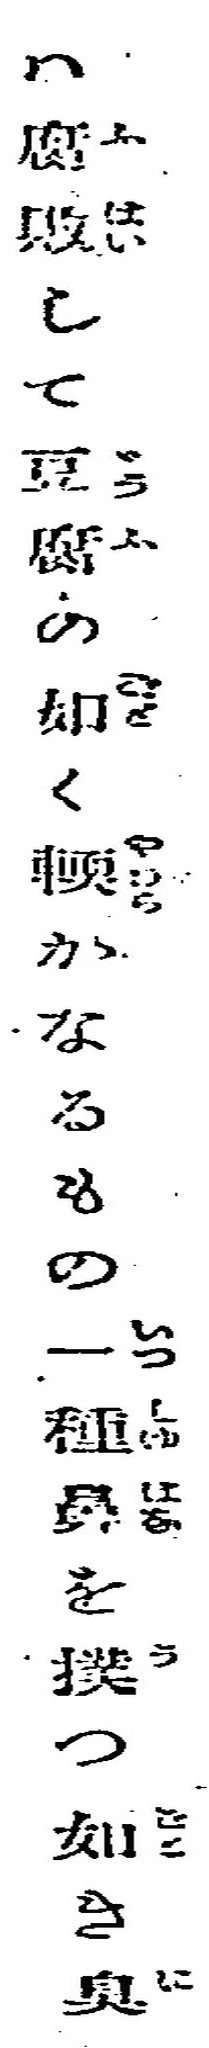は腐敗して豆腐の如く輭かなるもの一種鼻を撲つ如き臭
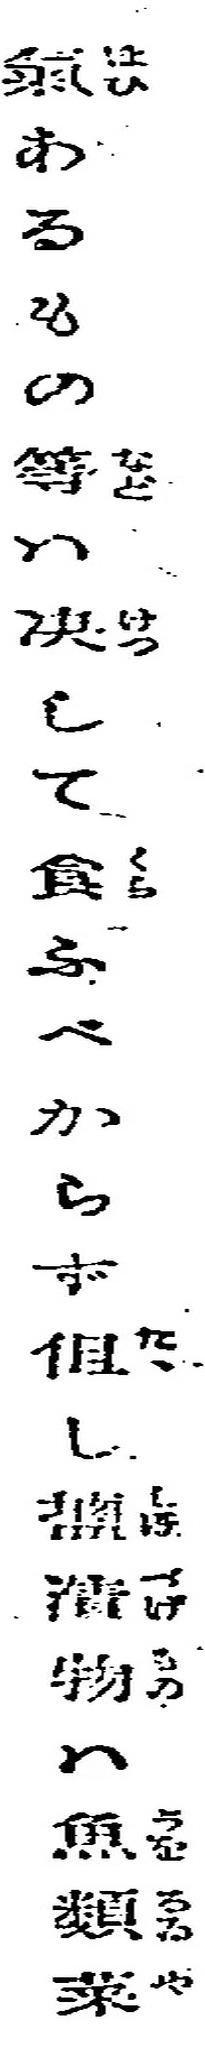氣あるもの等は決して食ふべからず但し鹽漬物は魚類菜
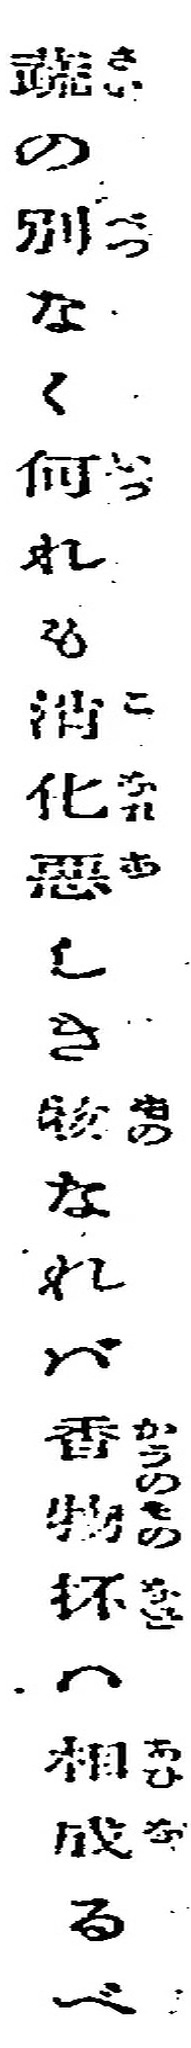蔬の別なく何れも消化悪しき物なれば香物抔は相成るべ
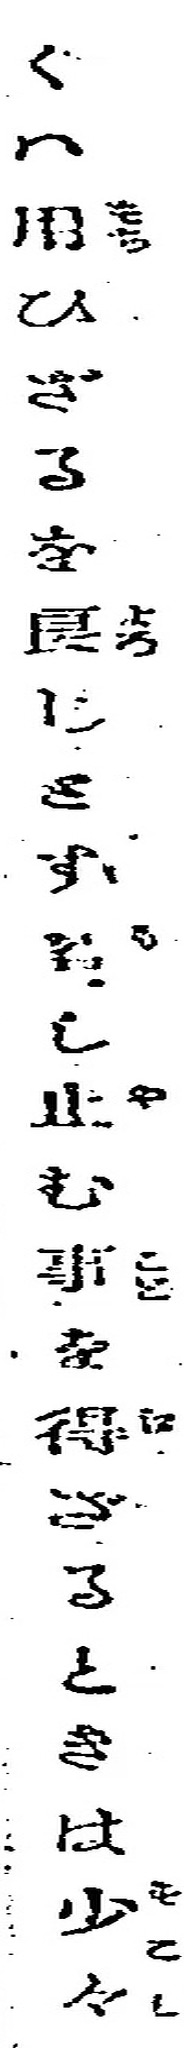くは用ひざるを良しとす若し止む事を得ざるときは少々
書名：新撰暑中養生法 : 附・コレラ予防歌
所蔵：国立国会図書館 National Diet Library, JAPAN
